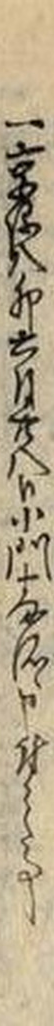一享保八卯六月廿八日小門番所へ申付候事
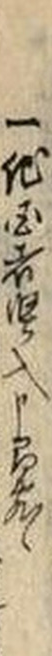一他国者堅入申間敷候
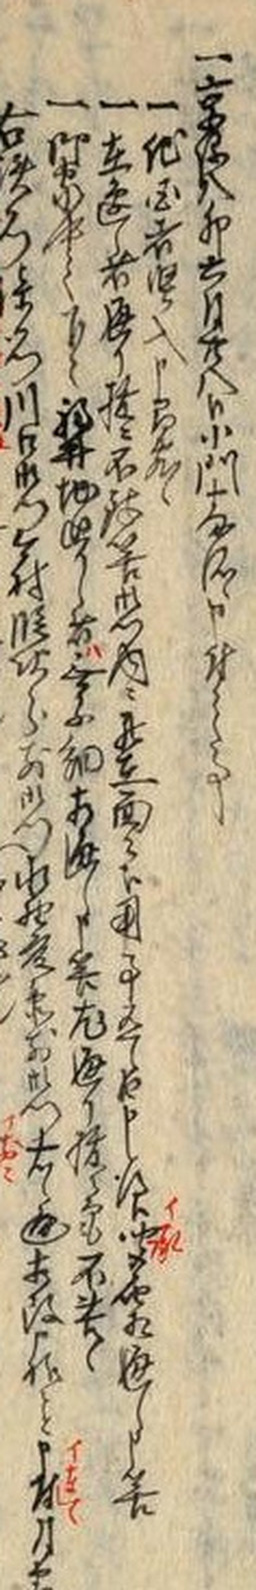一在辺之者通り抜に不致筈御門内に罷在面々は用事有之由申候得は承届相通申筈
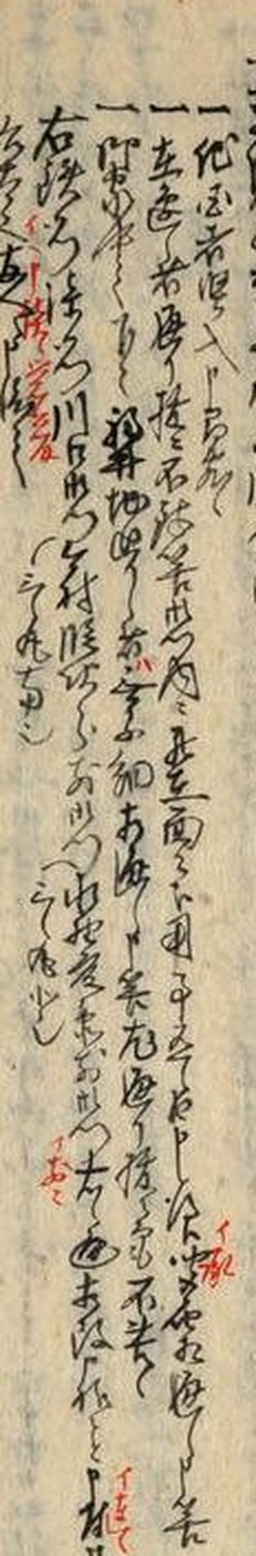一御家中之下々福井地廻り者は無子細相通申筈尤通り抜候而も不苦候
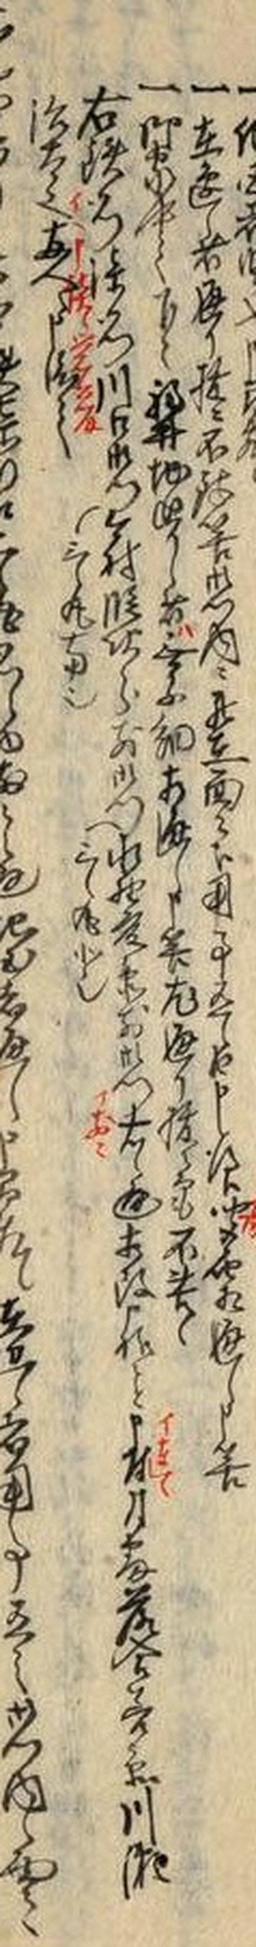右鉄御門漆御門川口御門今村勝次郎前御門水野藤兵衛前御門前々右之通相改候様にと申達月番落合善兵衛川瀬
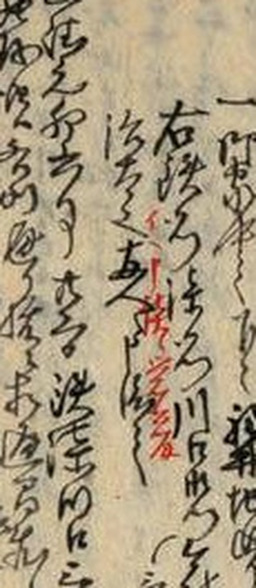治太夫両人江申渡之
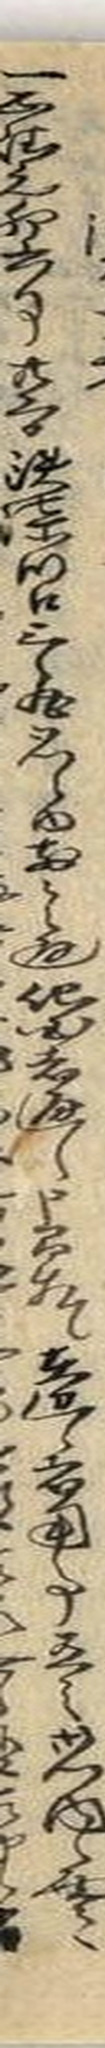一正徳元卯六月廿二日鉄漆川口三之丸御門之内前々之通他国者通し申間敷候在辺之者用事有之御門内之面々へ
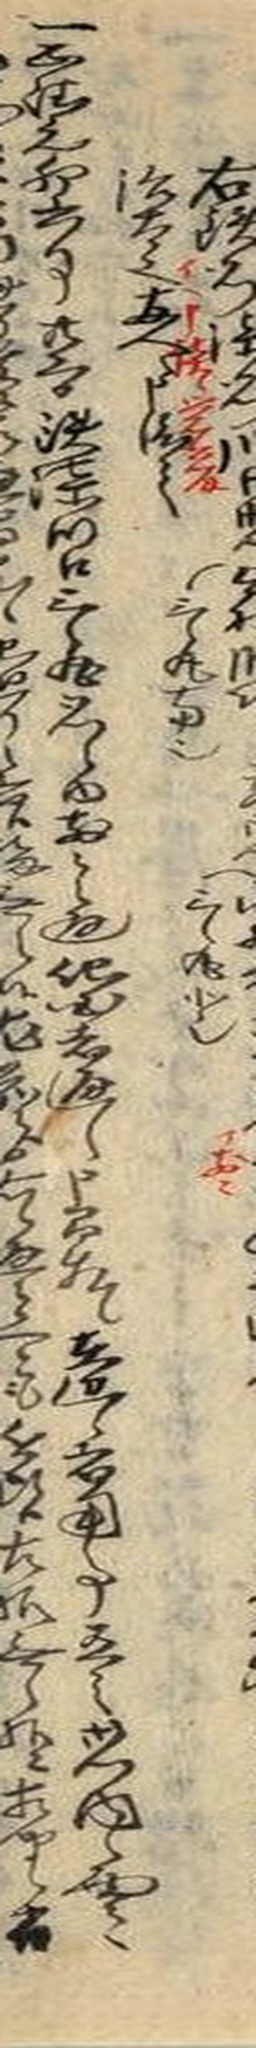一正徳元卯六月廿二日鉄漆川口三之丸御門之内前々之通他国者通し申間敷候在辺之者用事有之御門内之面々へ
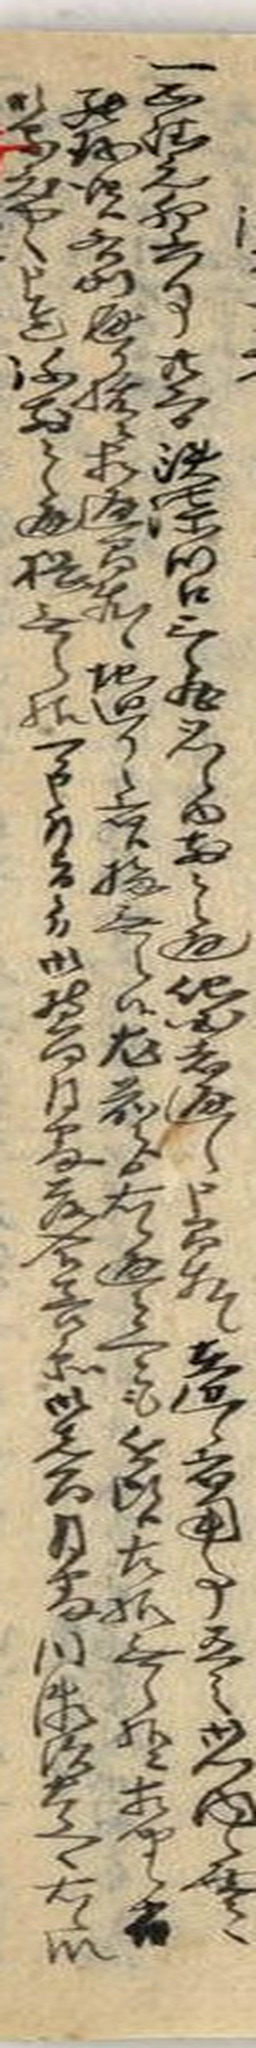御家老中へ申達弥前々通猥無之様可申付旨に付御持筒月番落合善善兵衛御先筒月番川瀬治太夫へ右之段
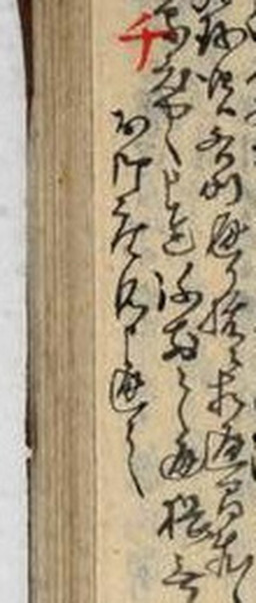於御座所申通之

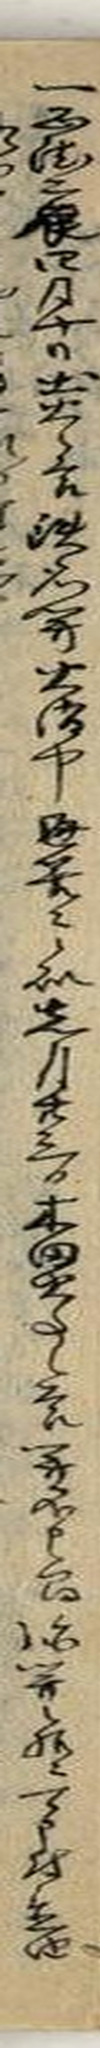一正徳二辰四月十日出火之節鉄御門開火消中通筈に候処先月廿三日木田火事之節開不申候間弥開候様に可申付置由
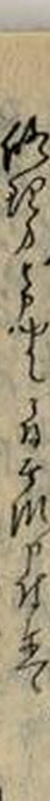修理方被申聞候に付其段申付置候
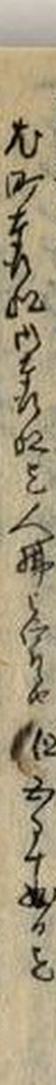尤町奉行組御奉行組迄人払被仰付候由但五月十八日迄
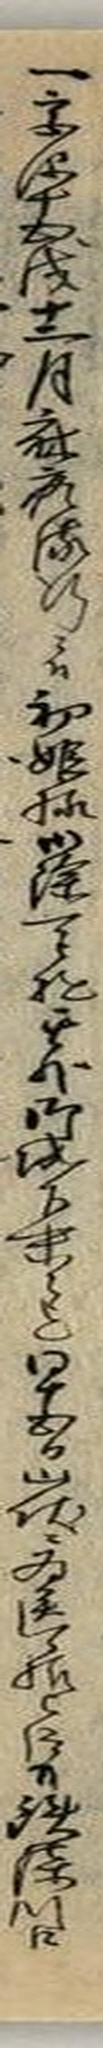一享保十五戌十二月麻疹流行に付初姫様御除可被遊其外御城下末々迄同十五日山伏に為送候様被仰付鉄漆川口
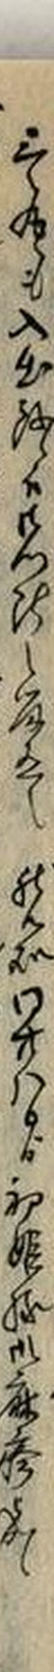三之丸へも入出致候に付御門断之留有之然ル処同廿八日ゟ初姫様御麻疹被成候
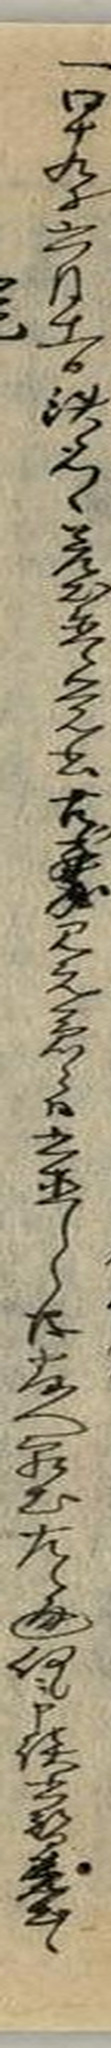一同十九寅六月十一日鉄御門へ差出置候覚書古く罷成見え兼候に付書直し候儀番人願出左之通何も申談書替差出候
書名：御門御櫓之部
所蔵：福井県文書館 Fukui Prefectural Archives
